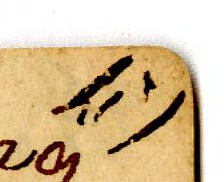47
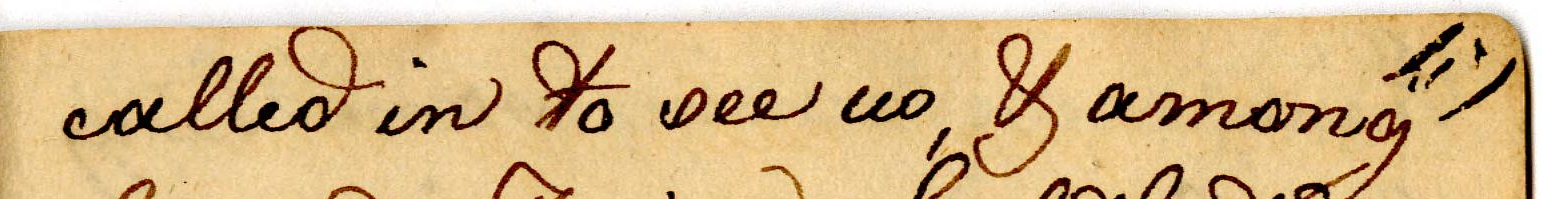called in to see us, & among
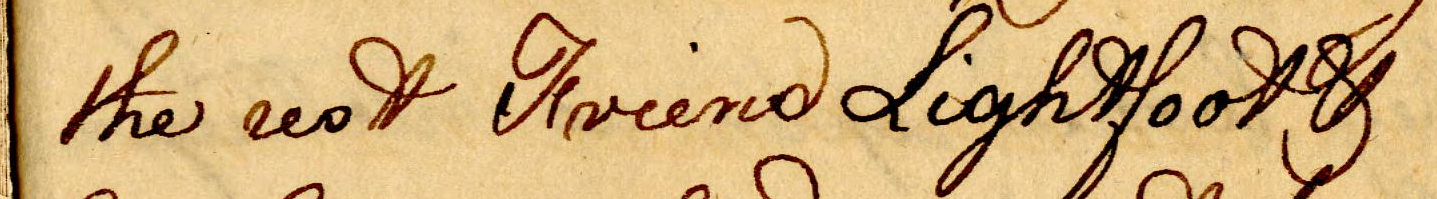the rest Friend Lightfoot &
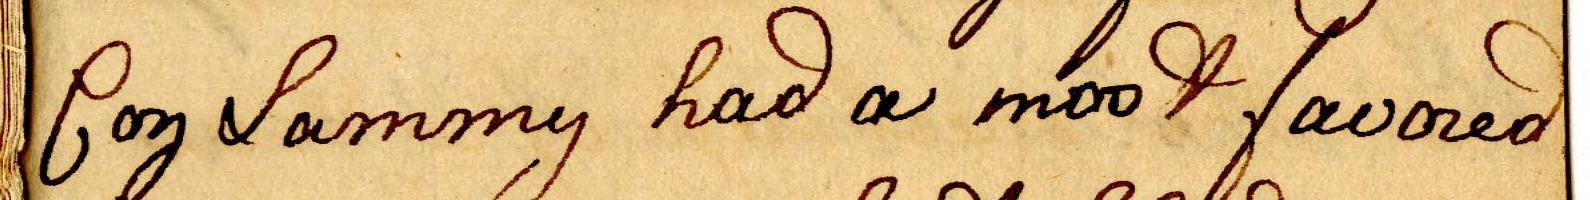Coz Sammy had a most favored
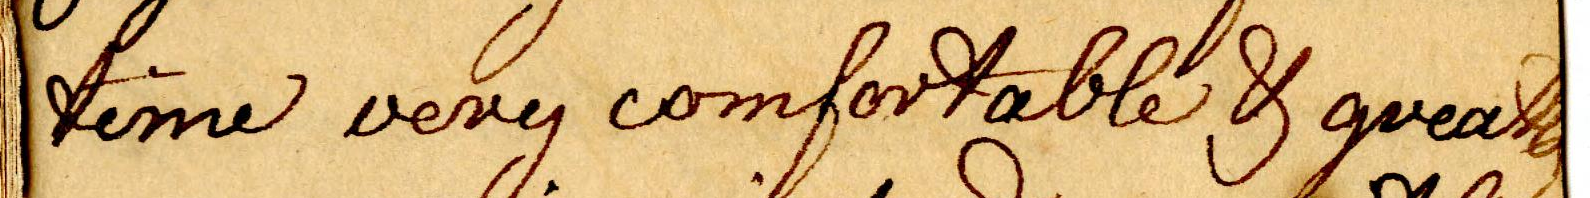time very comfortable & greatly
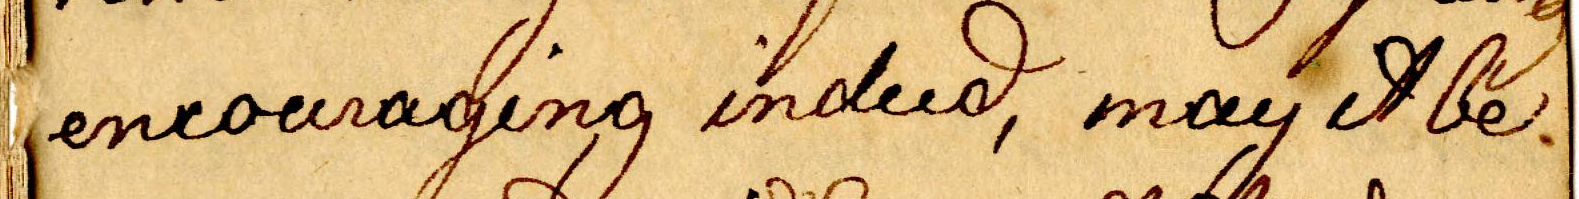encouraging indeed, may it be
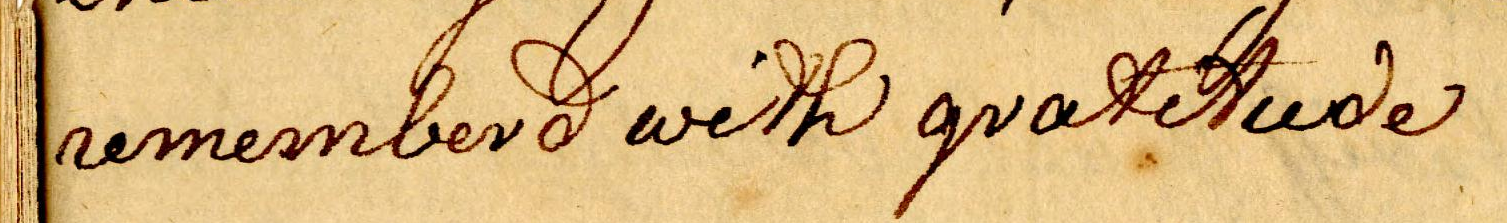rememberd with gratitude
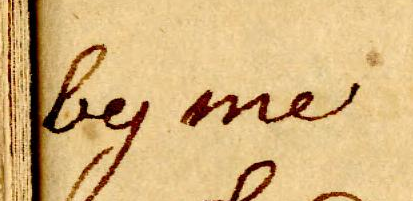by me
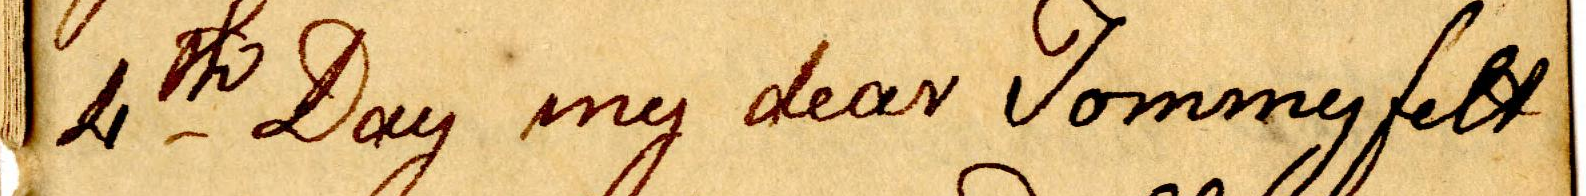4^th. Day my dear Tommy felt
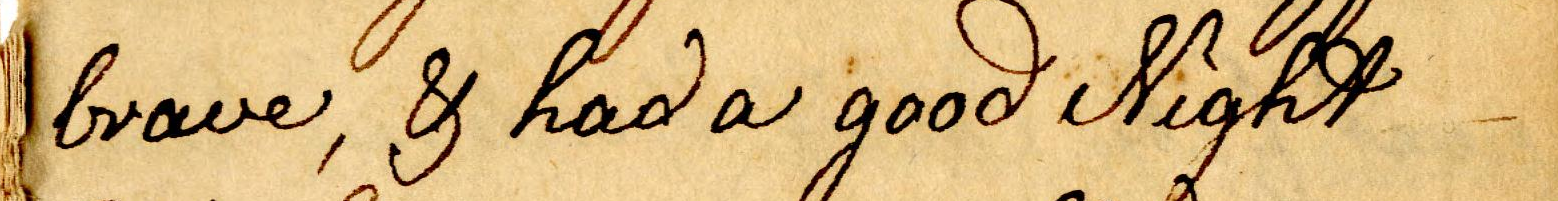brave, & had a good Night
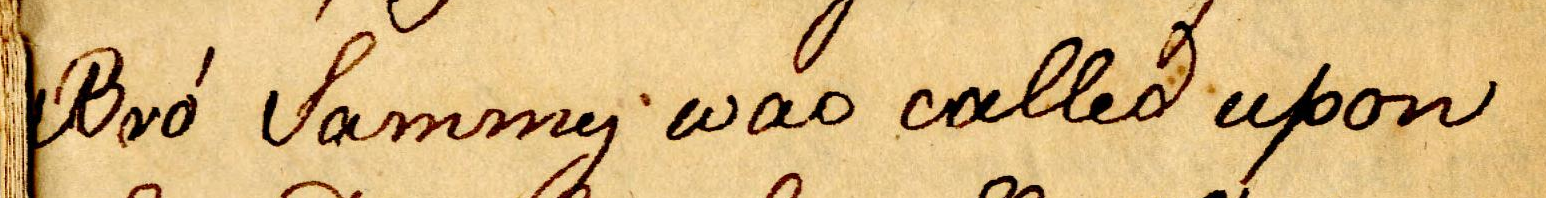Bro' Sammy was called upon
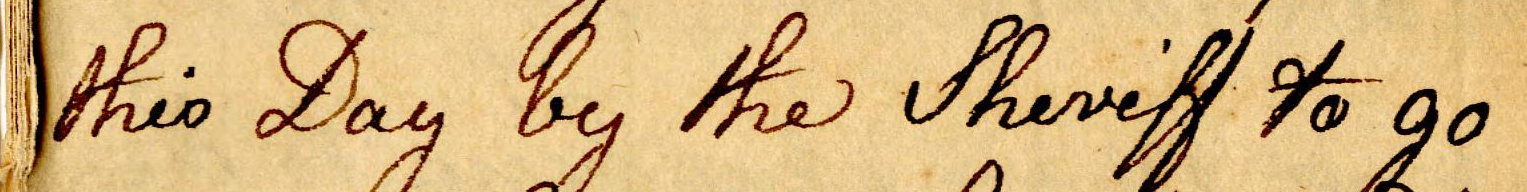this Day by the Sheriff to go
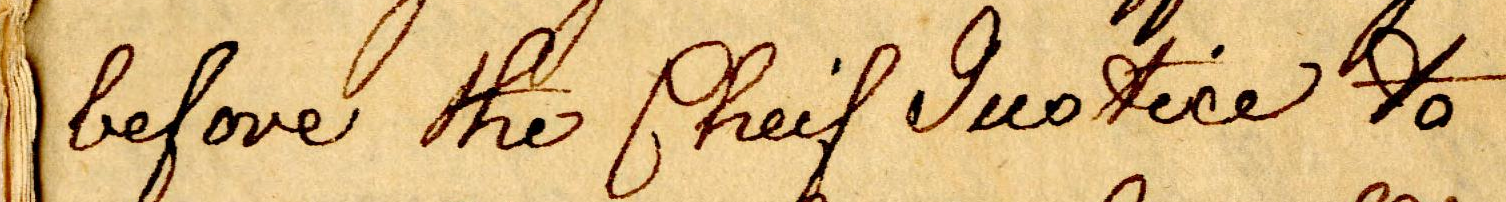before the Cheif Justice to
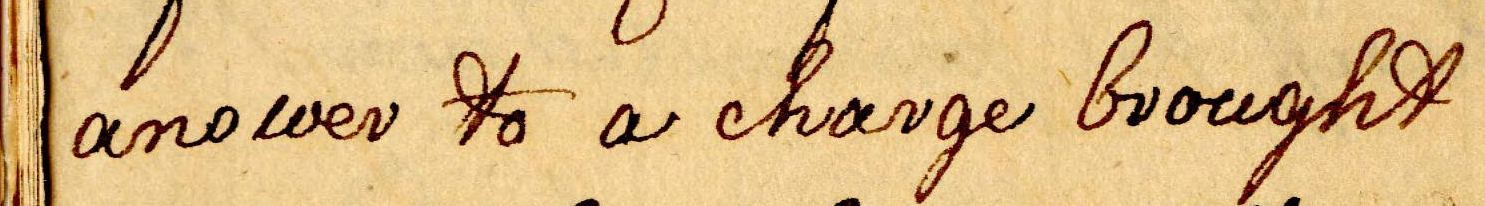answer to a charge brought
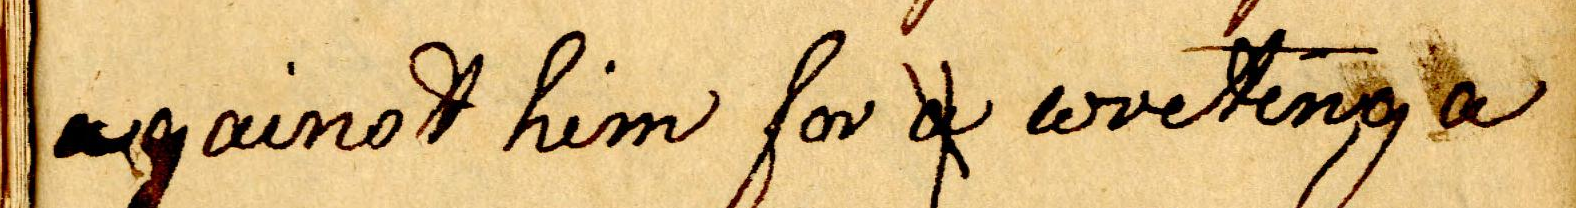against him for a writing a
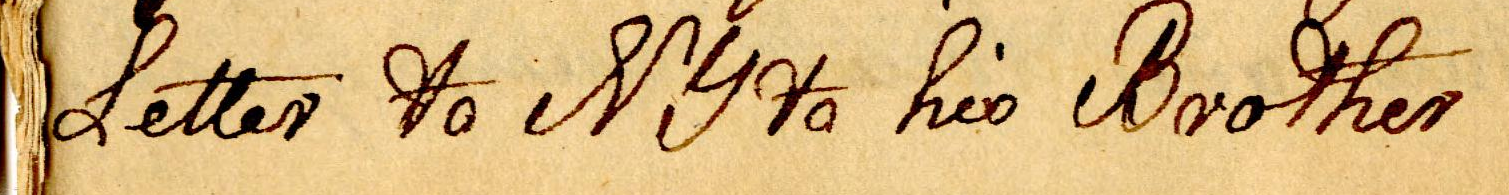Letter to NY to his Brother
